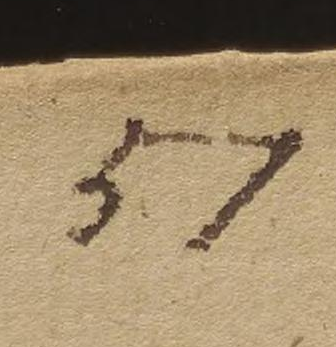57
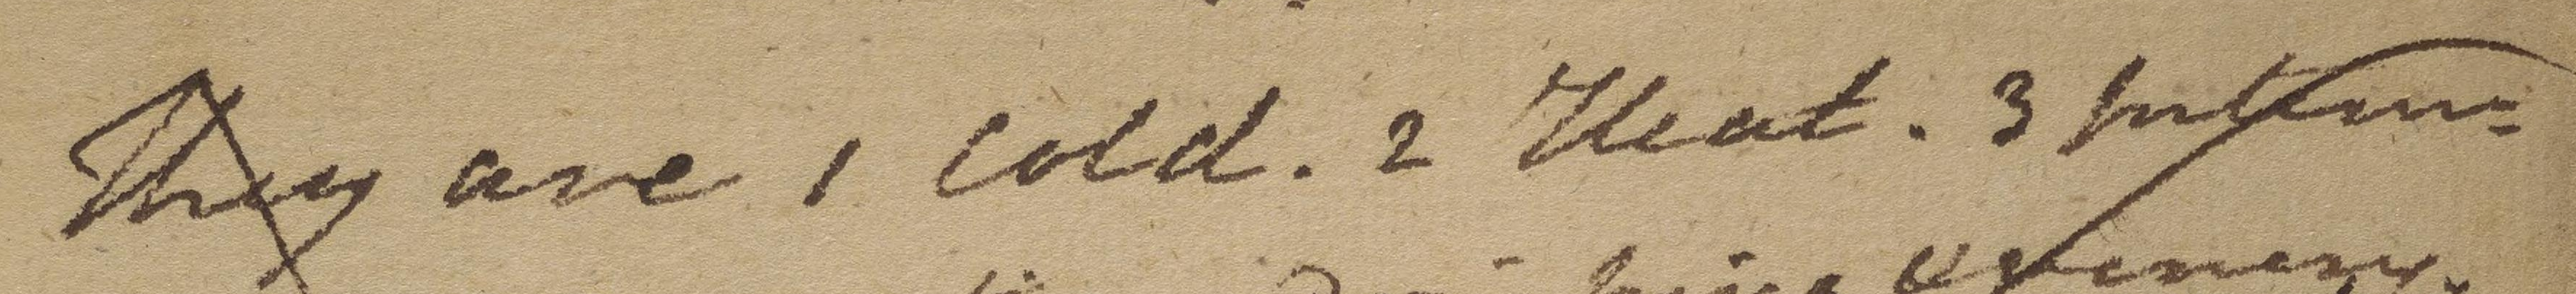They are 1 cold. 2 Heat. 3 Intem-
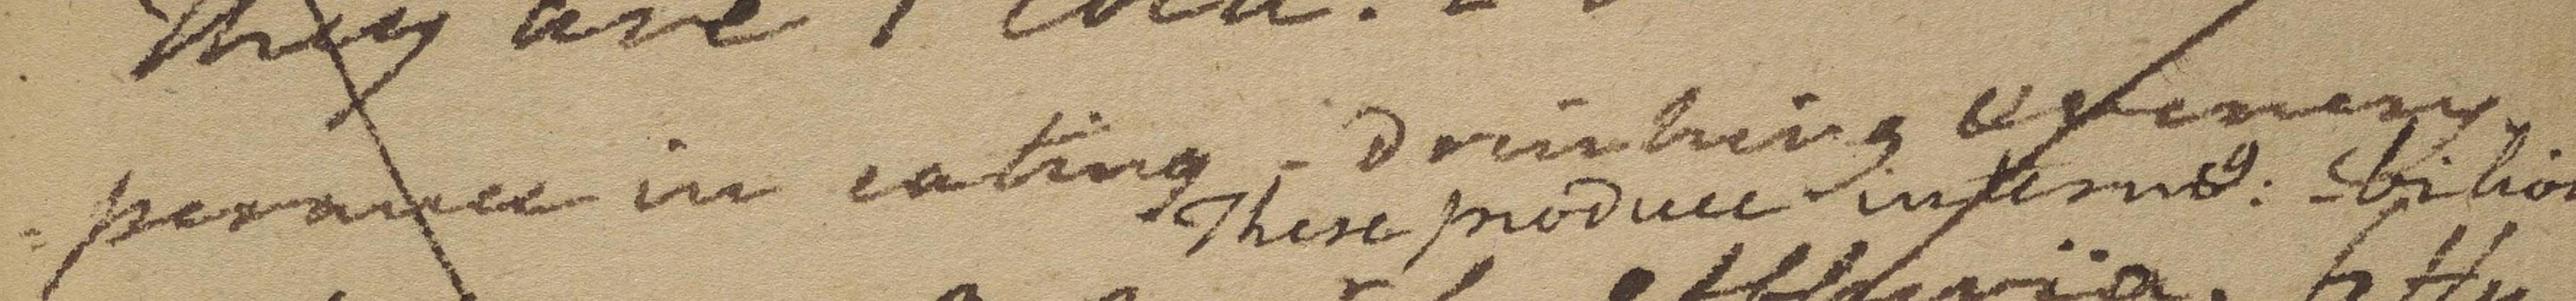perance in eating- drinking & venery
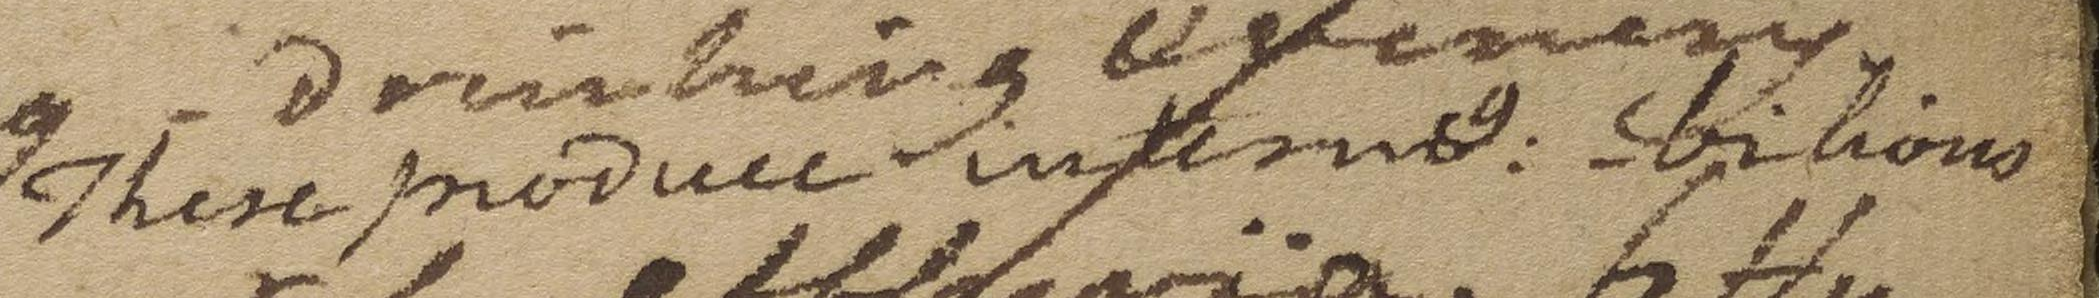These produce interm^g:- bilious
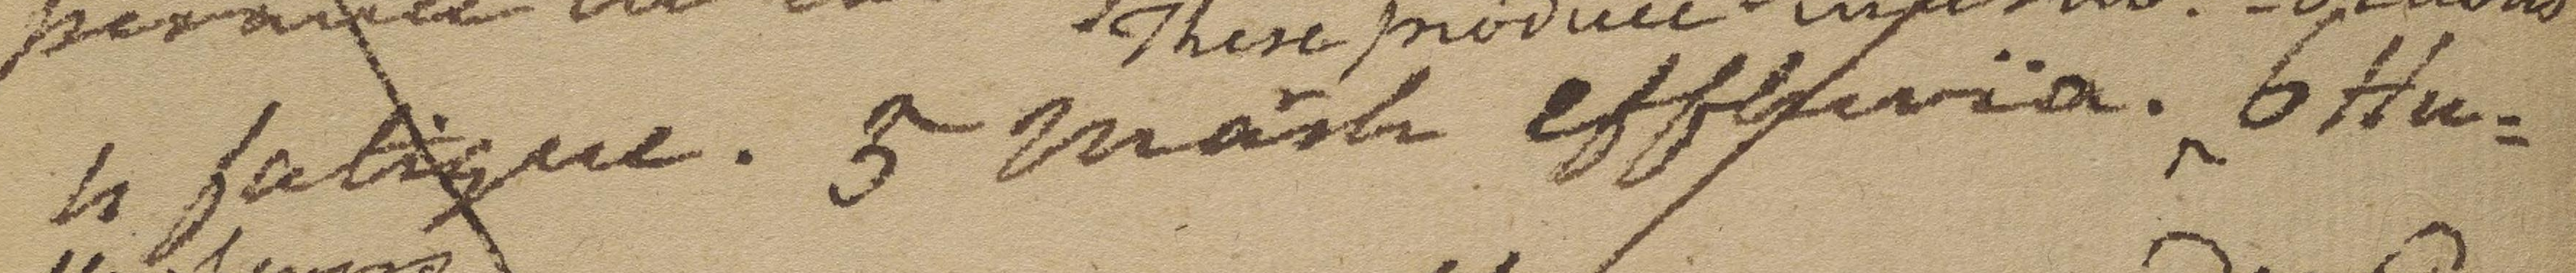in fatigue. 5 Marsh effluvia ^ 6 Hu-
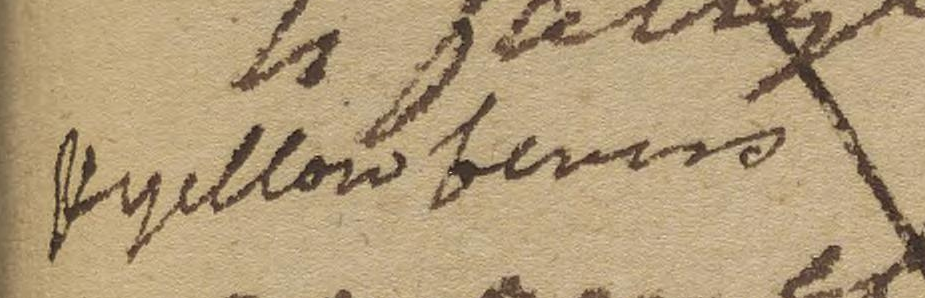& yellow fevers
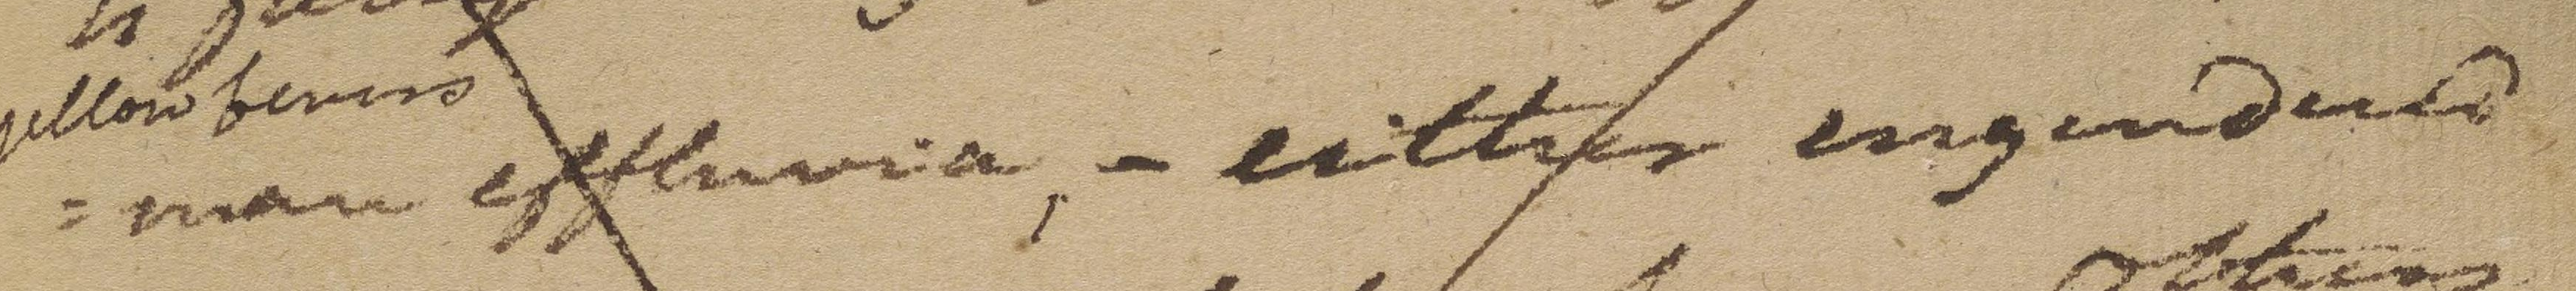-man effluvia,- either engendered
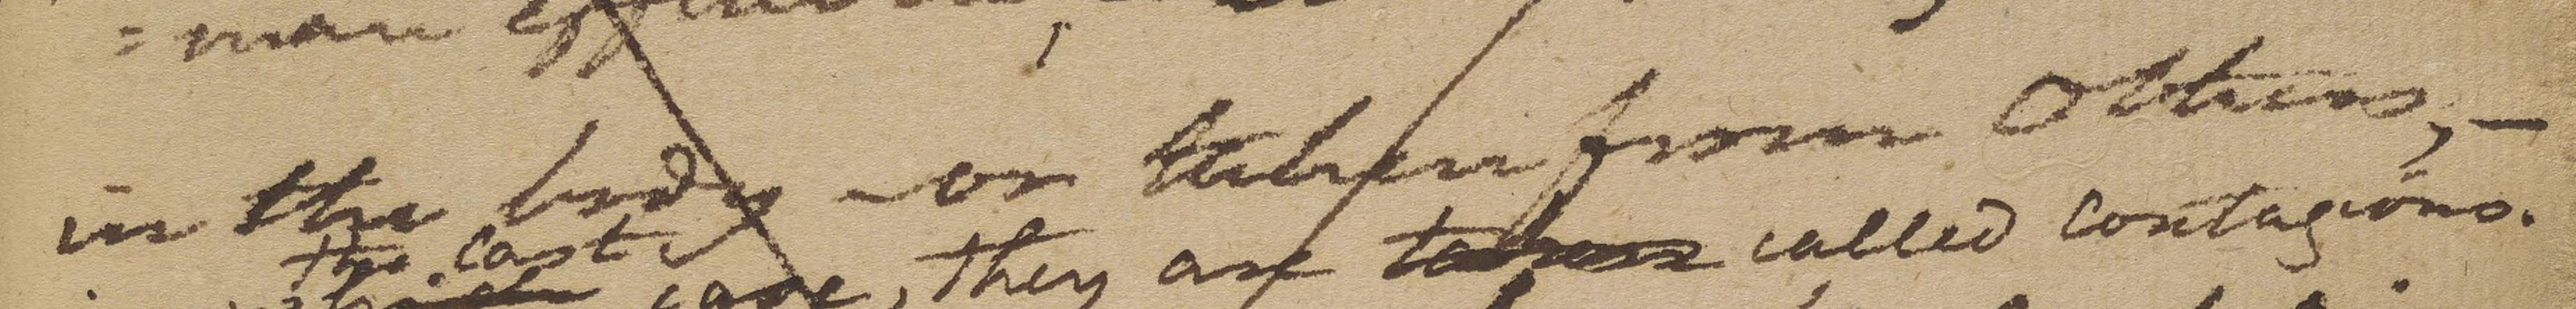in the body- or taken from others,-
